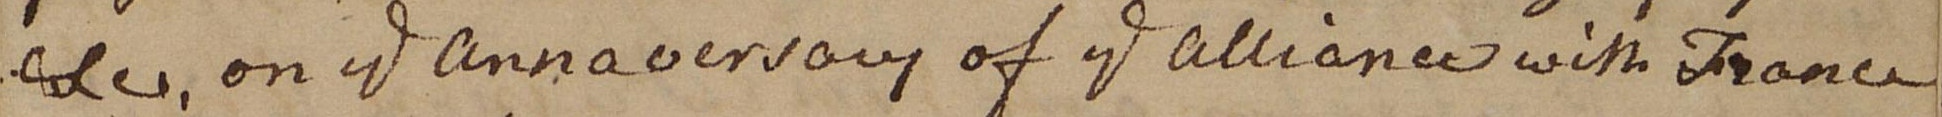&c, on y^e Annaversary of y^e alliance with France
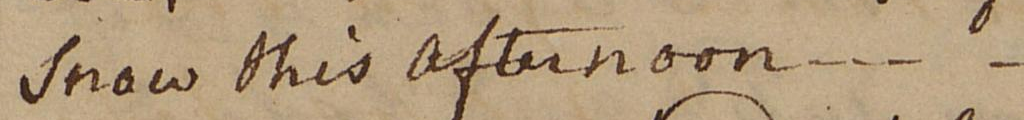Snow this afternoon--
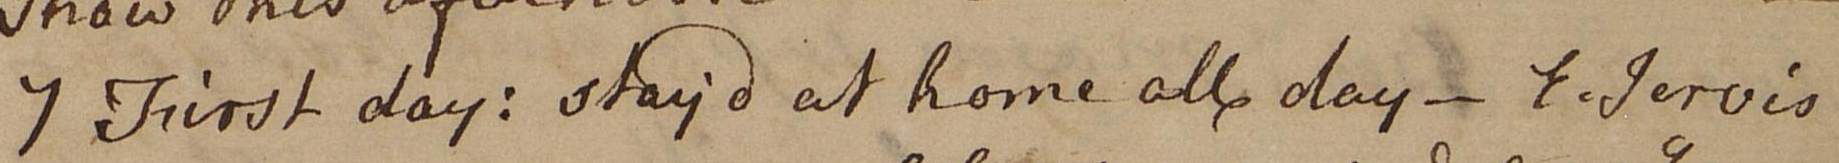7 First day: stay'd at home all day- E. Jervis
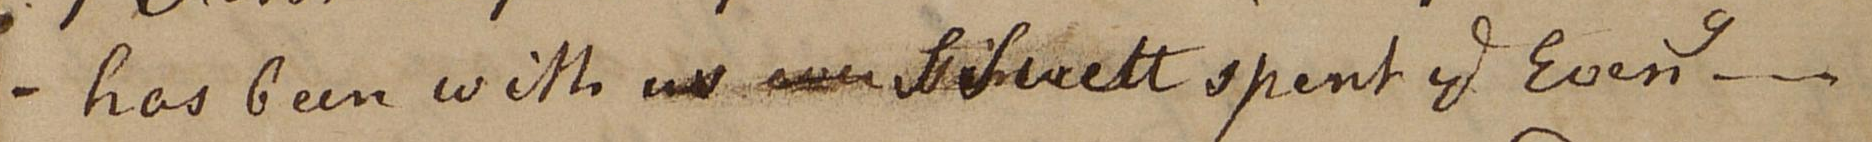has been with us [over] S Swett spent y^e Even^g-
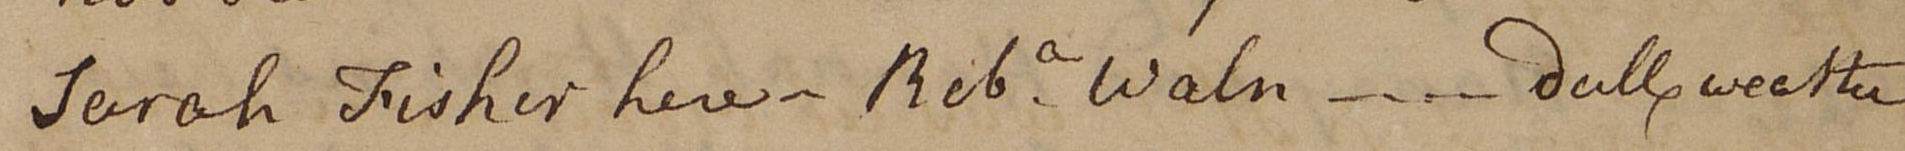Sarah Fisher here- Reb^a. Waln-- dull weather
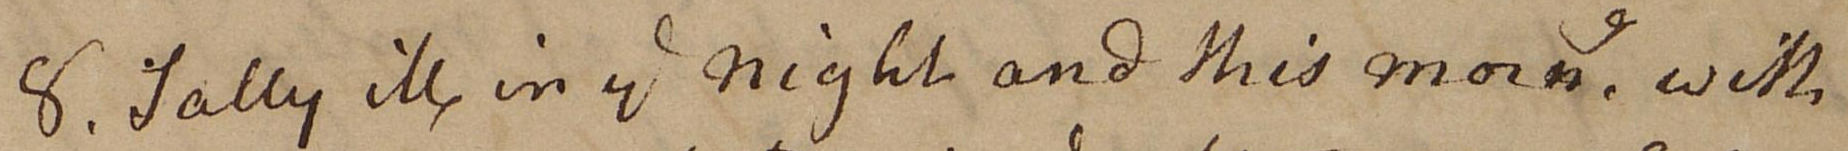8. Sally ill in y^e night and this morn^g. with
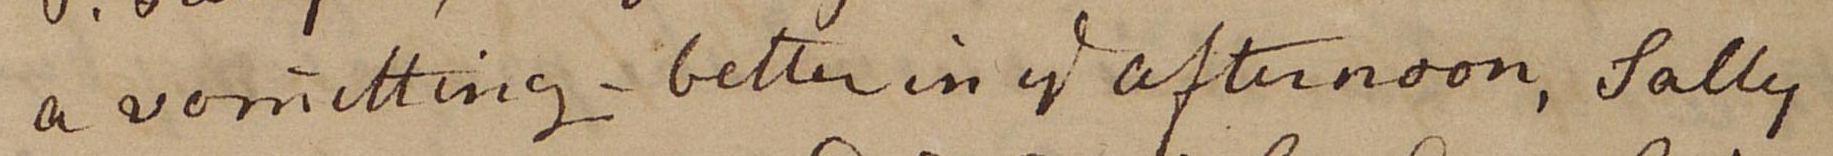a vomitting- better in y^e afternoon, Sally
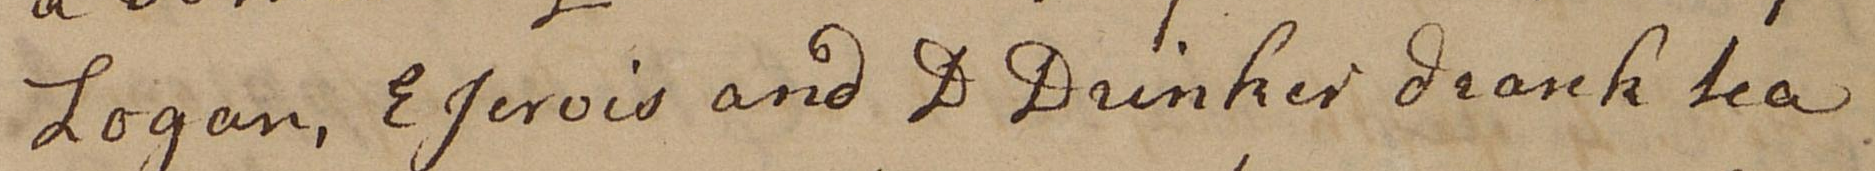Logan, E Jervis and D Drinker drank tea
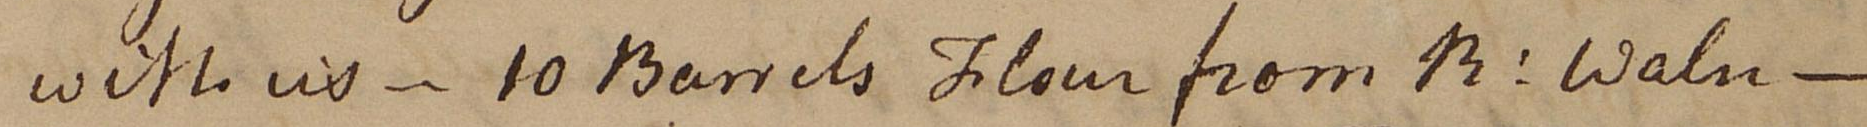with us- 10 Barrels Flour from R: Waln-
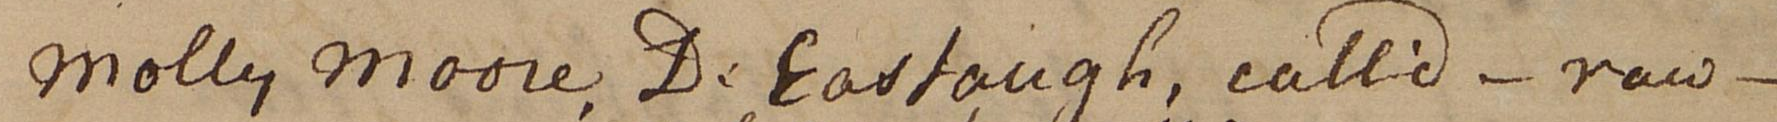Molly Moore D: Eastaugh, call'd- raw-
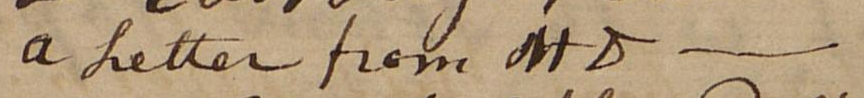a Letter from MD-
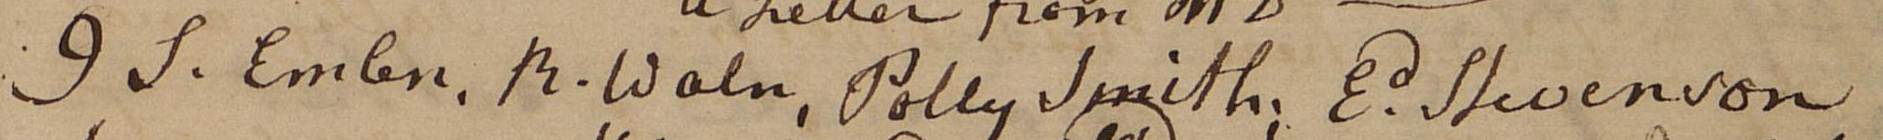9 S. Emlen, R. Waln, Polly Smith; E^d. Stevenson
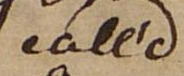call'd
